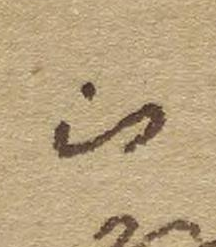is
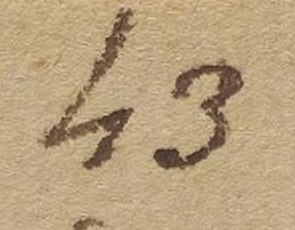43
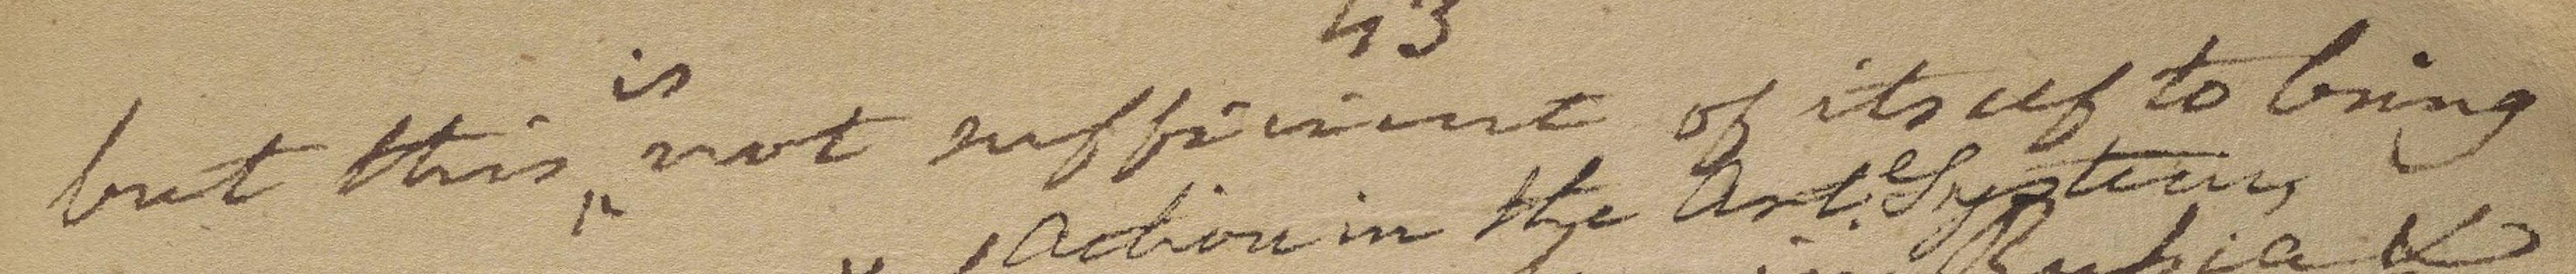but this ^ not sufficient of itself to bring
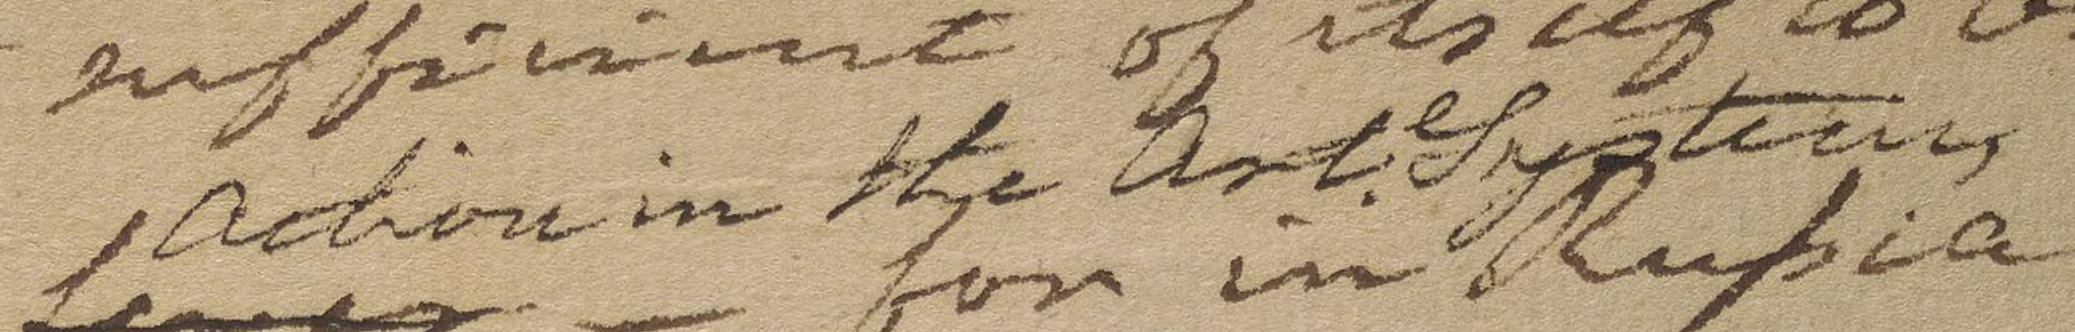action in the Art. Systems
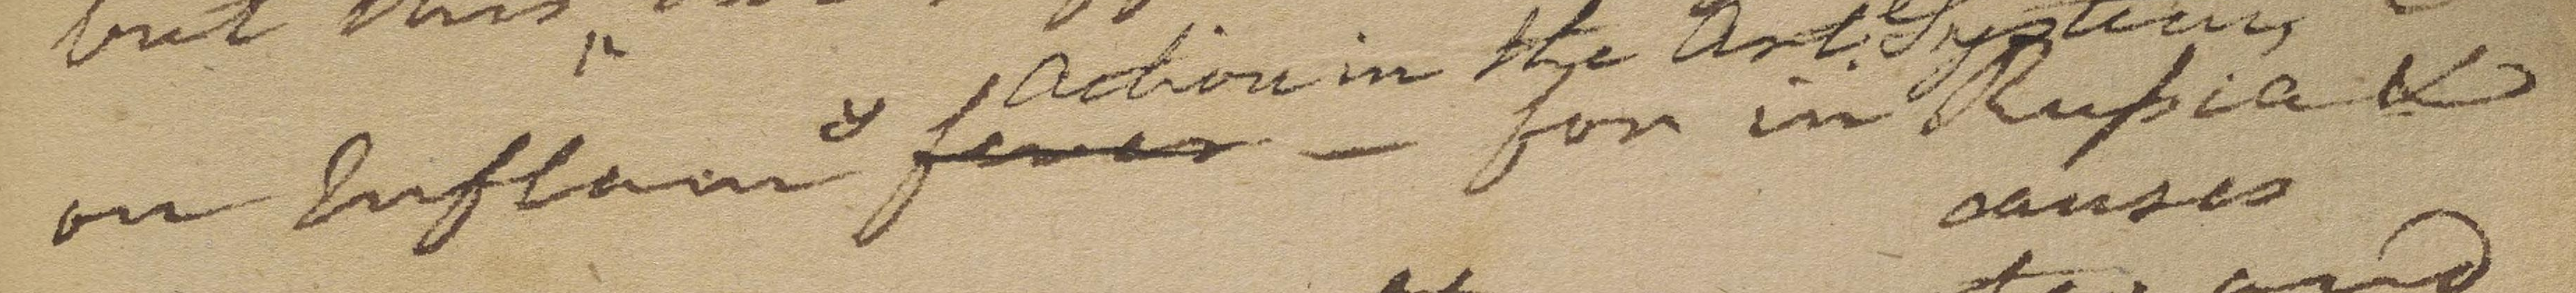on inflam^y [fever], for in Russia &
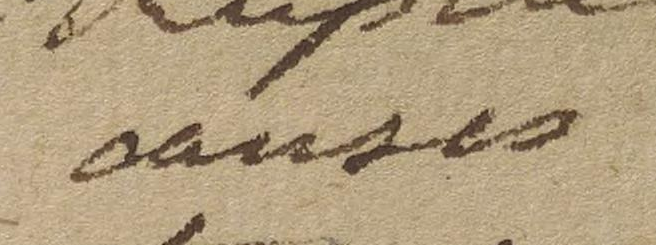senses
